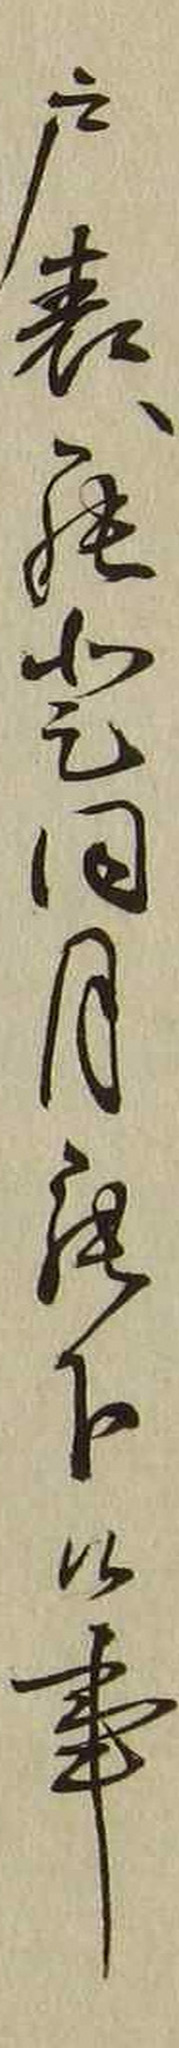戸表へ罷登同月罷下候事
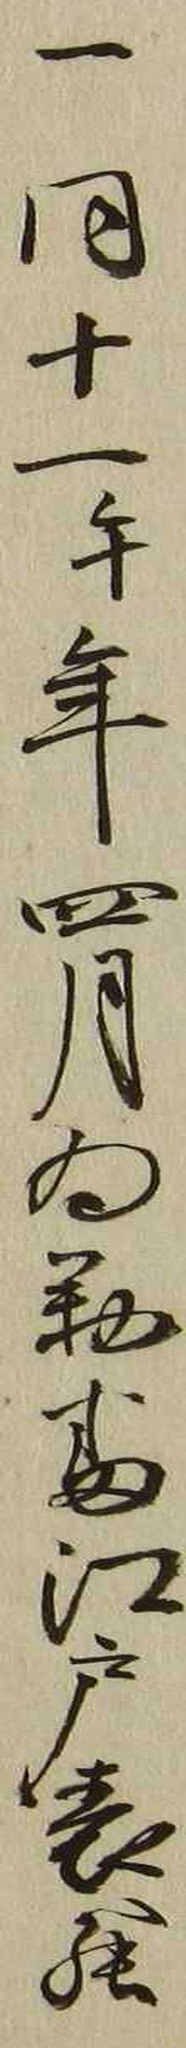一同十一午年四月為勤番江戸表へ罷
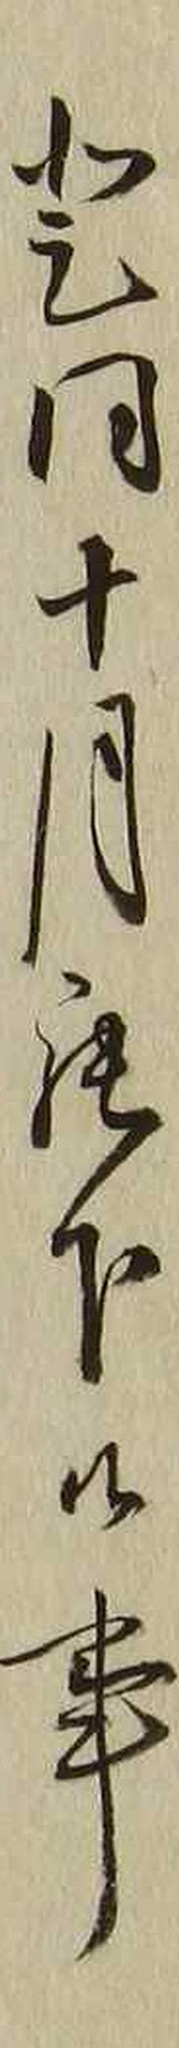登同十月罷下候事
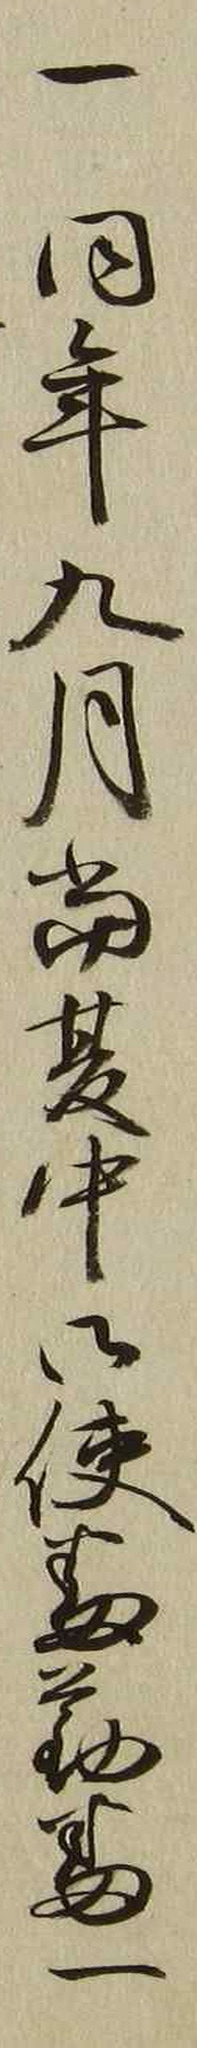一同年九月当夏中御使番勤番一
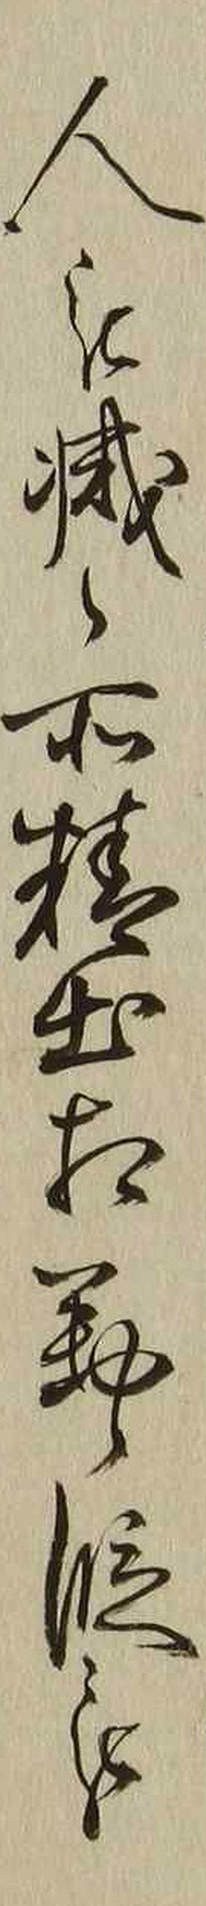人被減候所精出相勤候段被
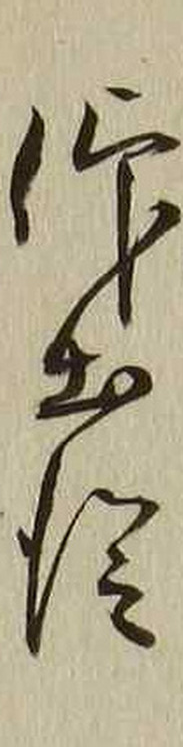仰出従
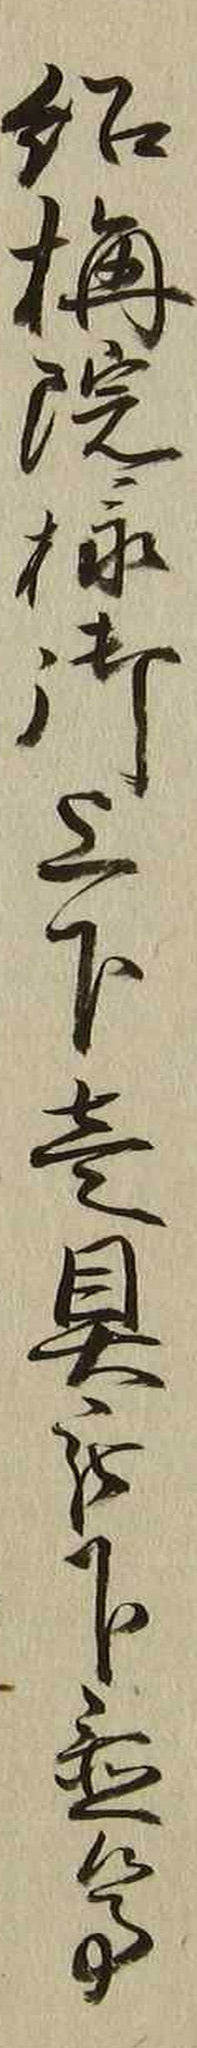紹栴院様御上下壱具被下置候事
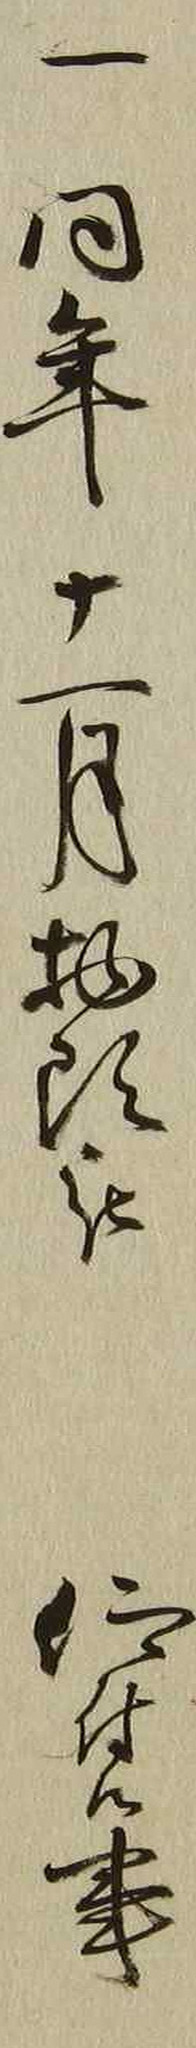一同年十一月物頭被仰付候事
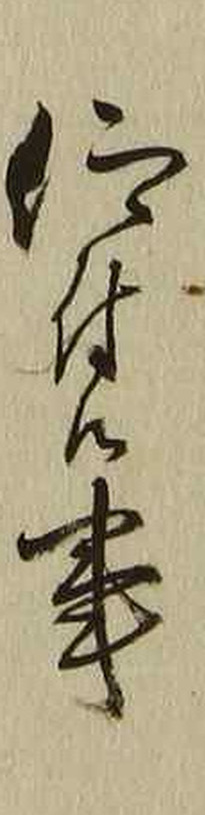仰付候事
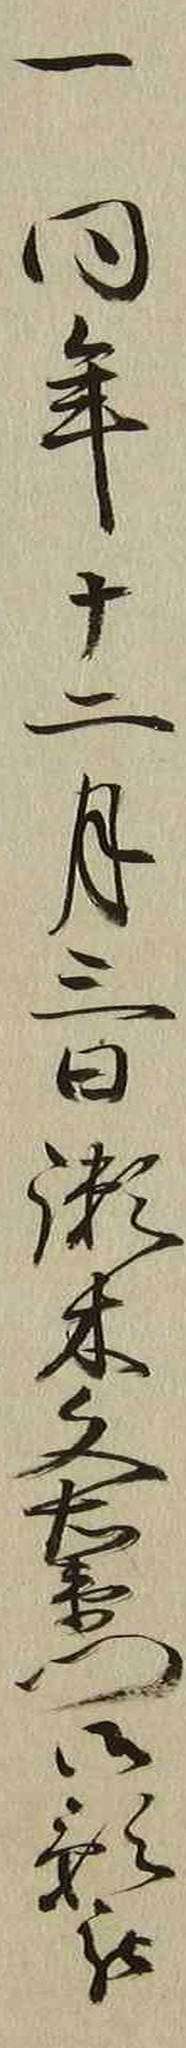一同年十二月三日瀬木久右衛門御預被
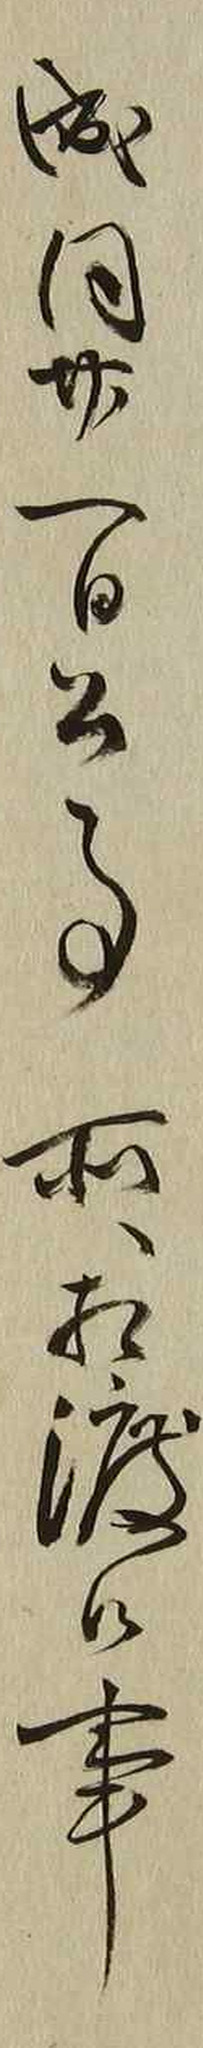成同廿一日公事所へ相渡候事
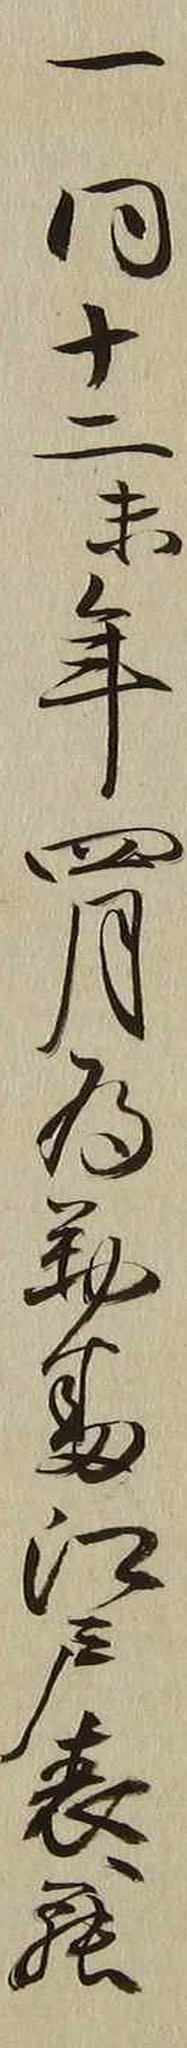一同十二未年四月為勤番江戸表へ罷
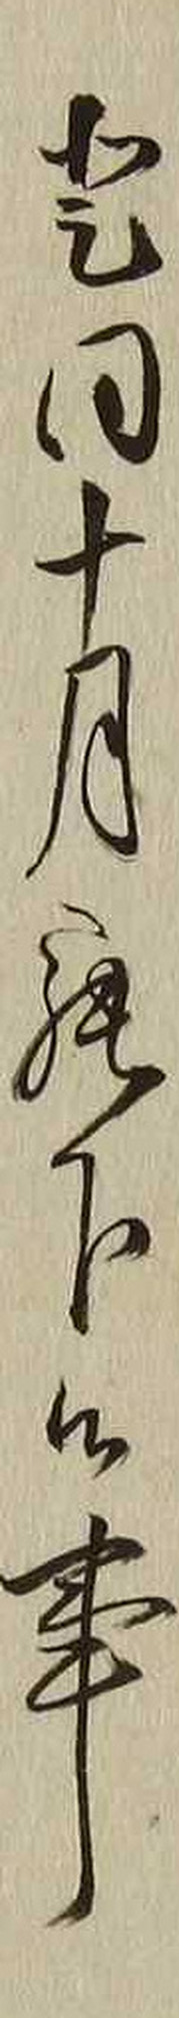登同十月罷下候事
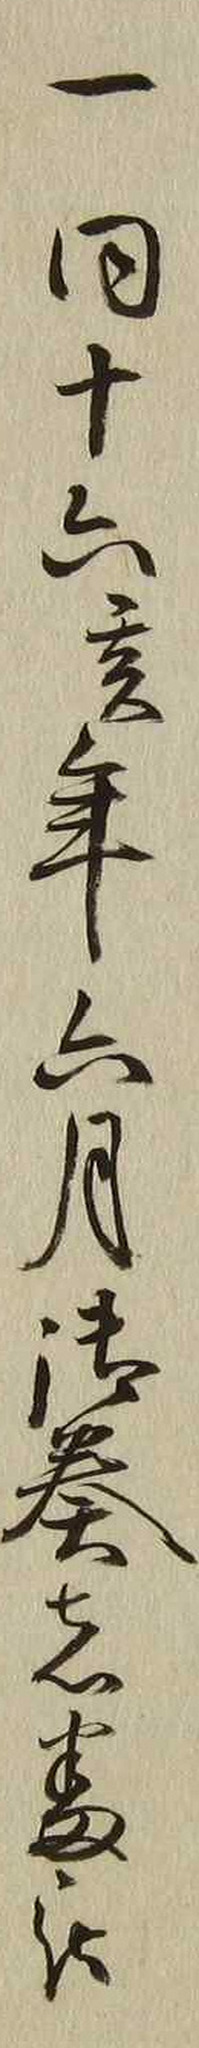一同十六亥年六月御奏者番被
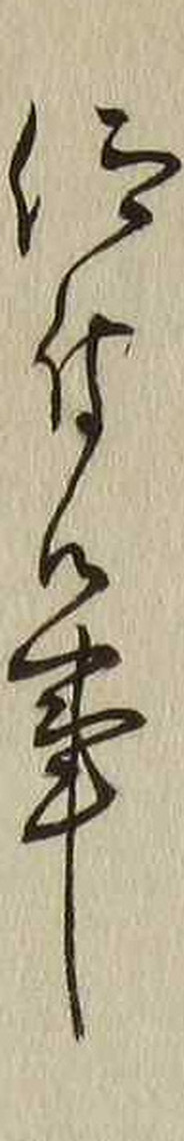仰付候事
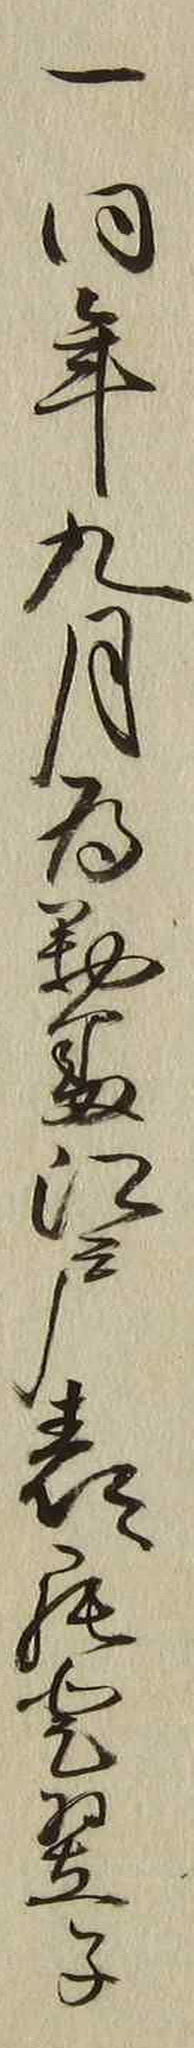一同年九月為勤番江戸表へ罷登翌子
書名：諸士系譜　巻之60　と之部3
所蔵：会津若松市立会津図書館
